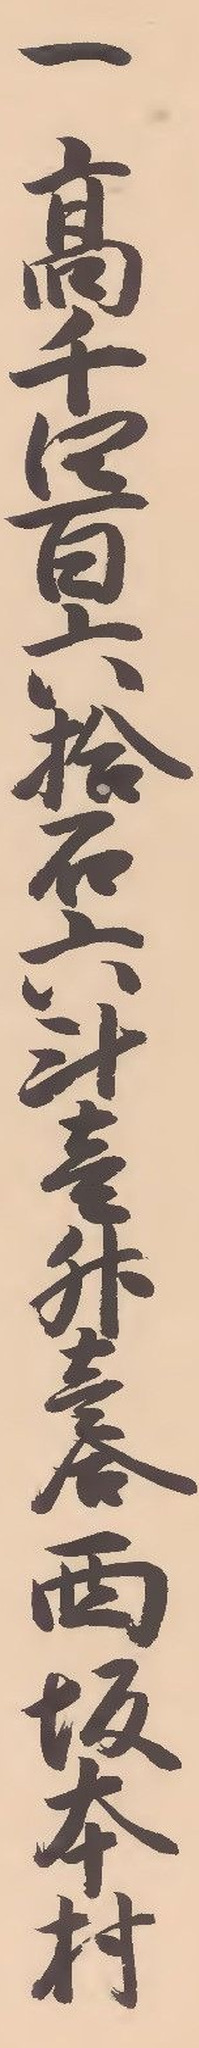一高千四百六拾石六斗壱升壱合西坂本村
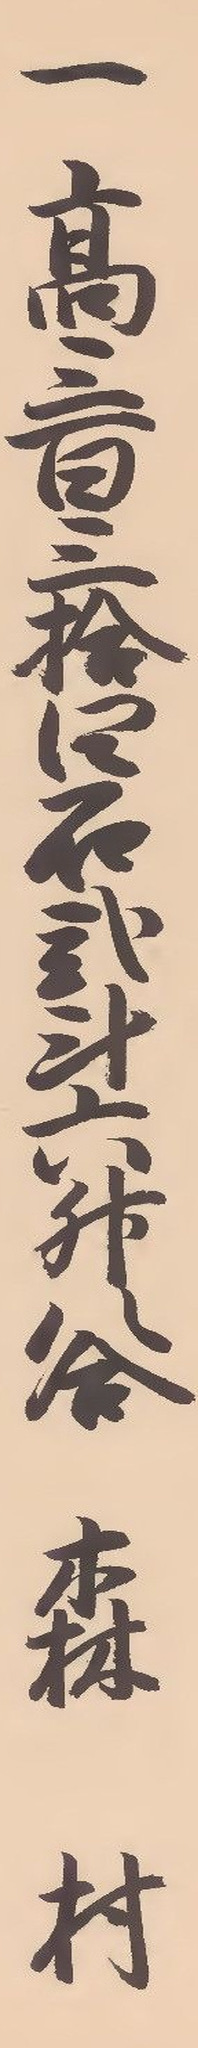一高三百三拾四石弐斗六升八合森村
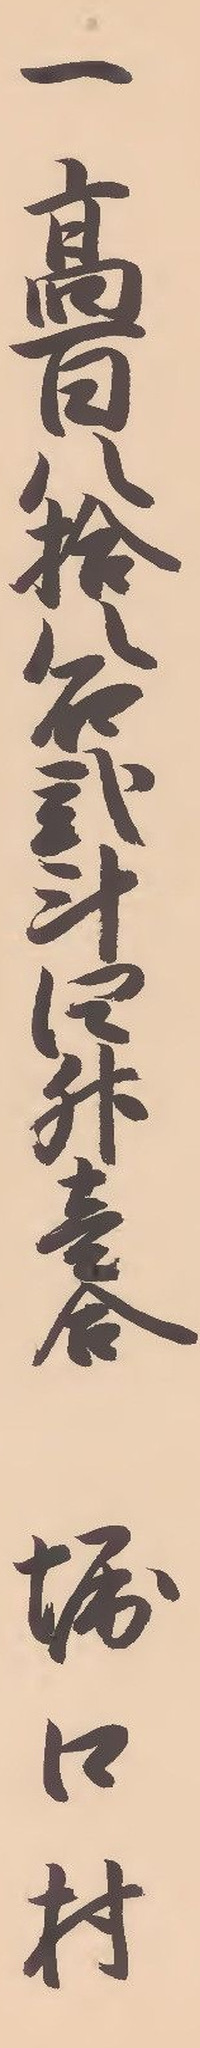一高百八拾八石弐斗四升壱合堀口村
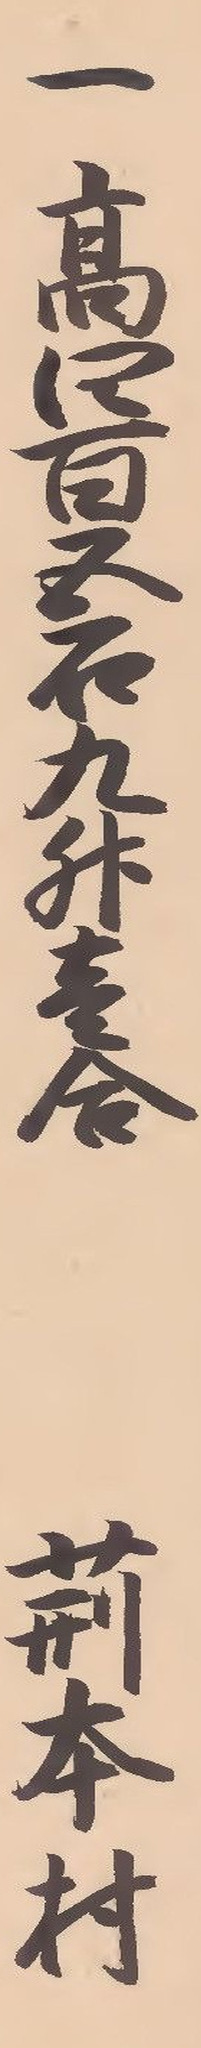一高四百五石九升壱合荊本村
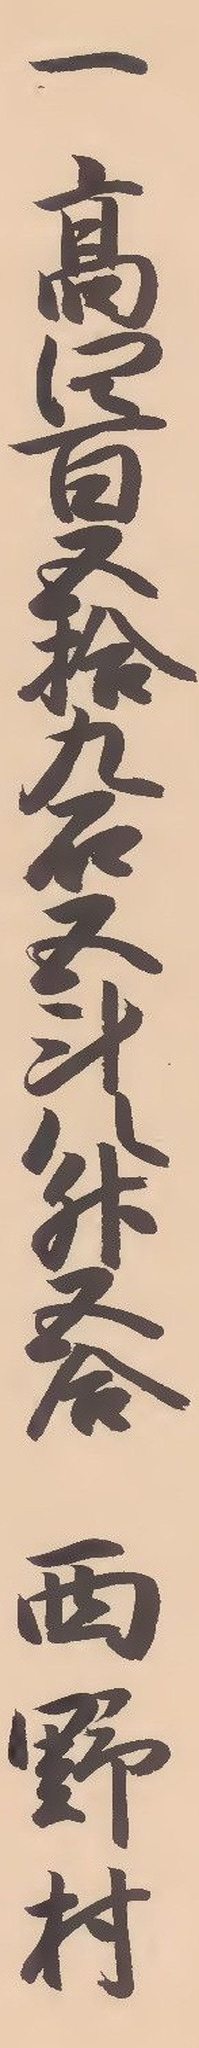一高四百五拾九石五斗八升五合西野村
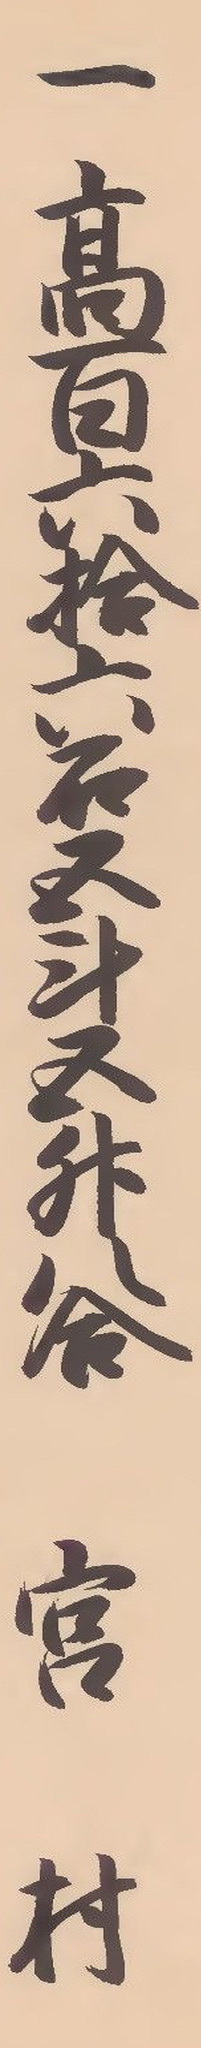一高百六拾六石五斗五升八合宮村
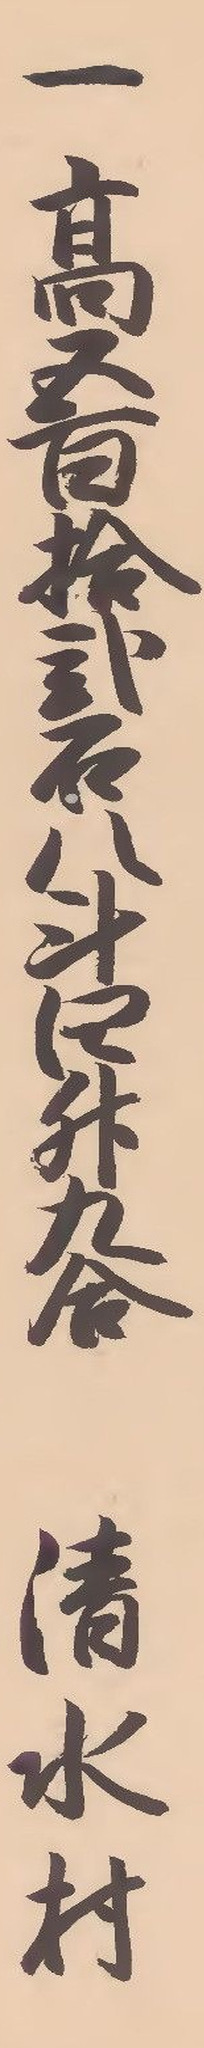一高五百拾弐石八斗四升九合清水村

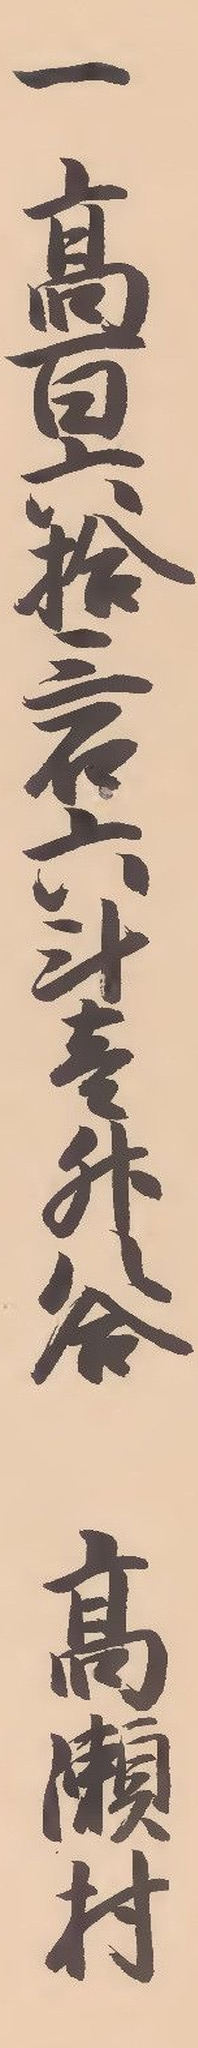一高百六拾三石六斗壱升八合高瀬村
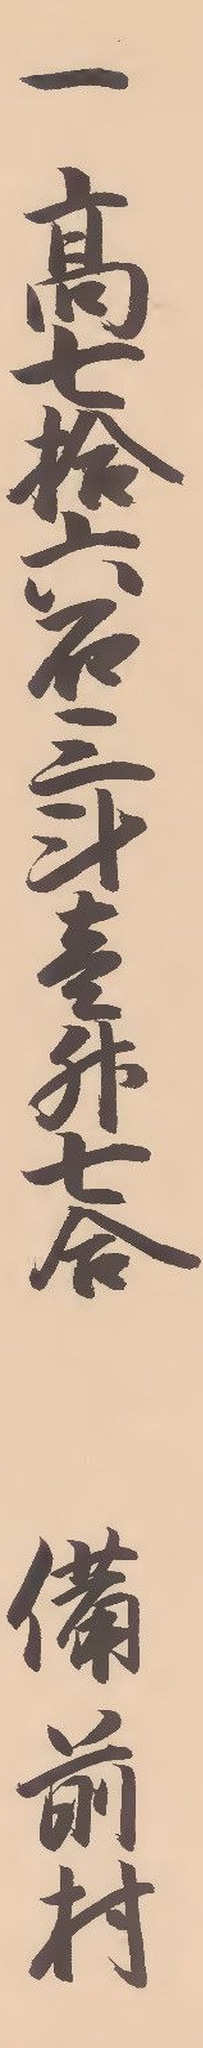一高七拾六石三斗壱升七合備前村
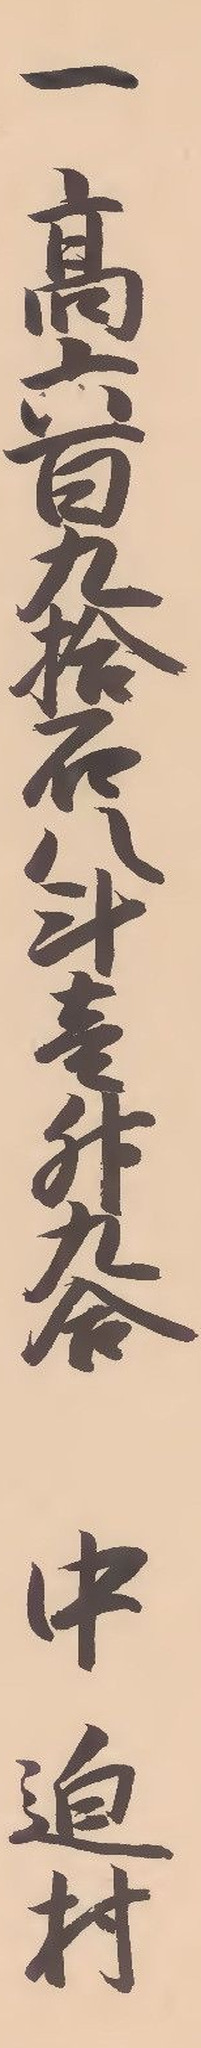一高六百九拾石八斗壱升九合中迫村
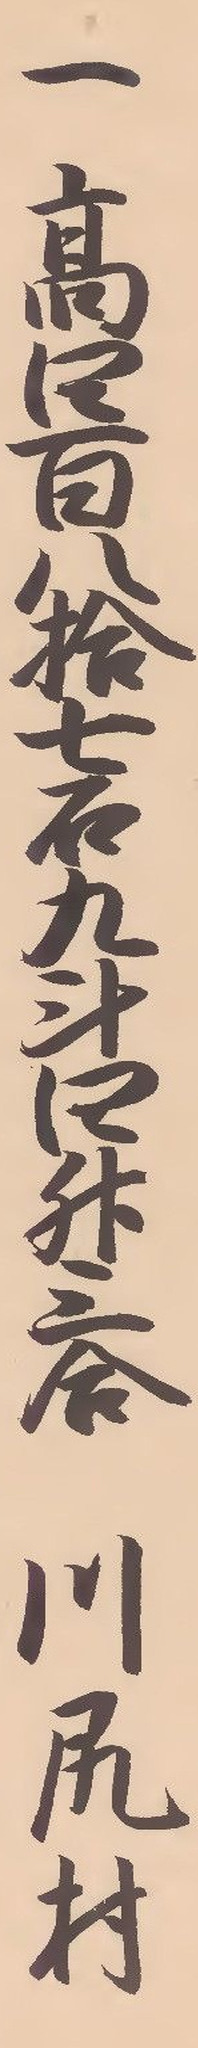一高四百八拾七石九斗四升三合川尻村
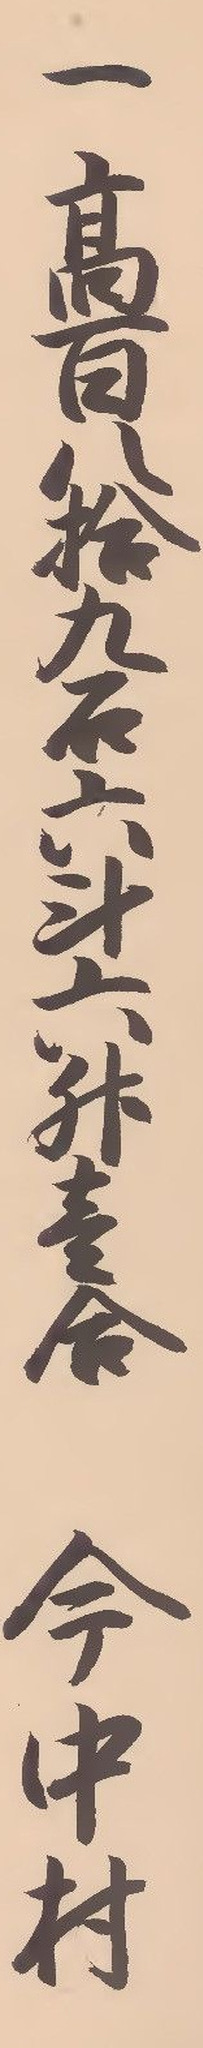一高百八拾九石六斗六升壱合今中村
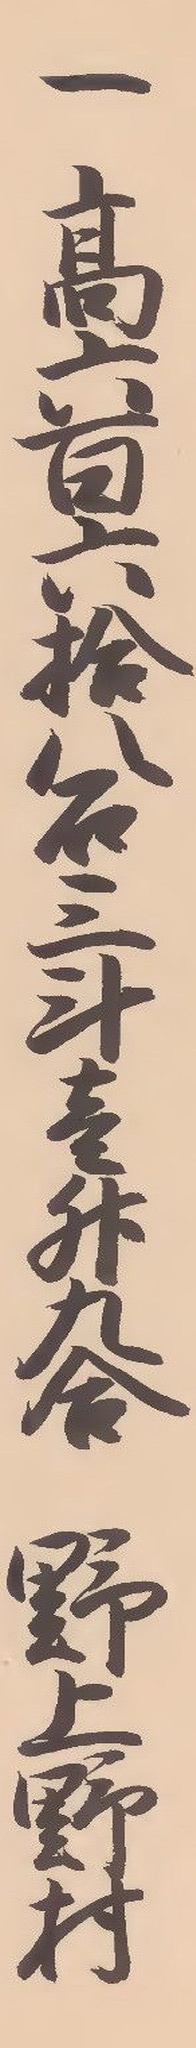一高六百六拾八石三斗壱升九合野上野村
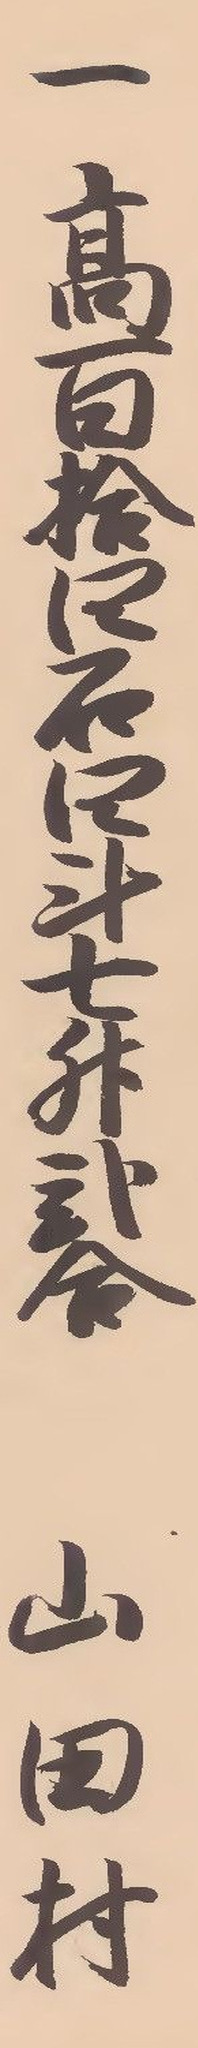一高百拾四石四斗七升弐合山田村
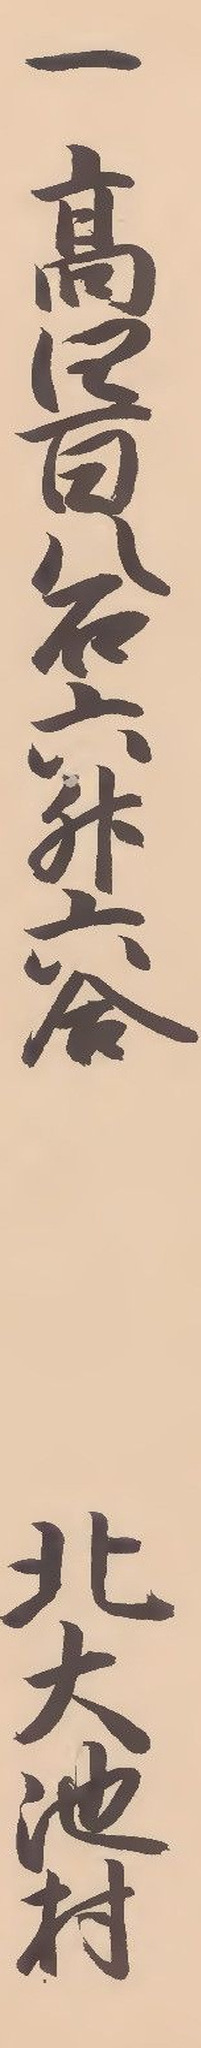一高四百八石六升六合北大池村

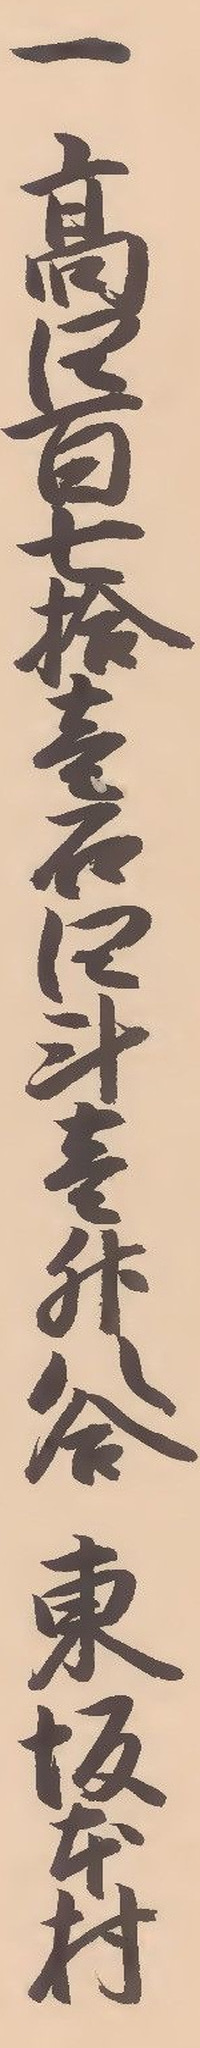一高四百七拾壱石四斗壱升八合東坂本村
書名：紀伊国郷帳
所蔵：国立公文書館 National Archives of Japan
